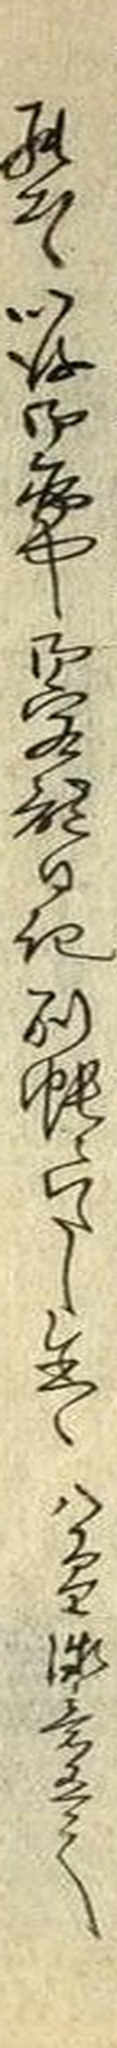罷出候以後御病中御容軆日記別帳ニいたし置候八百里微意有之
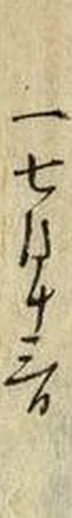一七月十三日
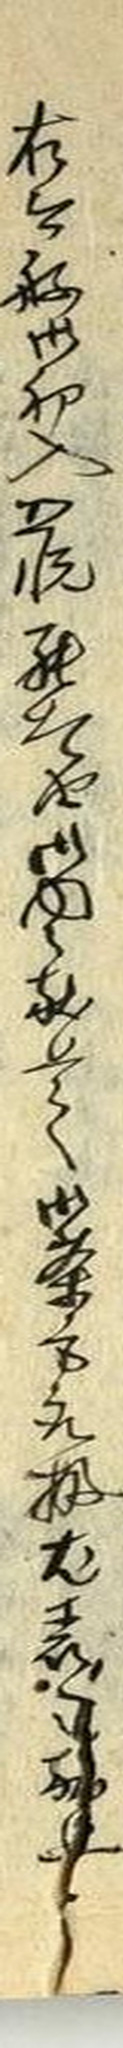右今般御初入恐悦罷出候由御内々献上之御茶方取扱尤表へ献上
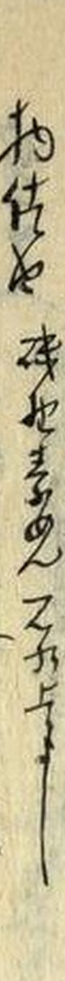物仕候由磯野素めん一箱上候よし
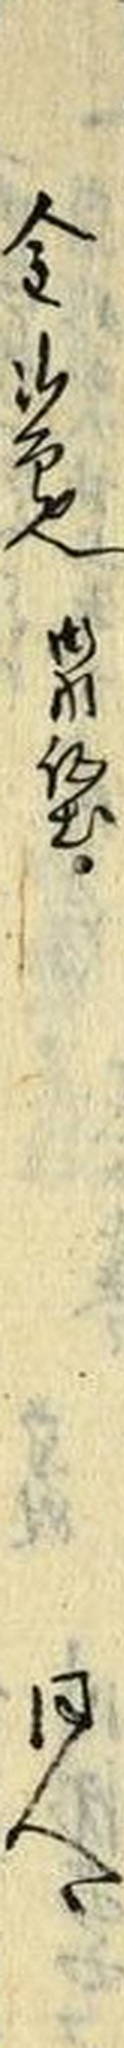金弐百疋御内証出同人へ
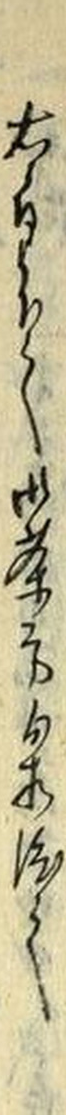右ニ付被下之御茶方ゟ相渡之
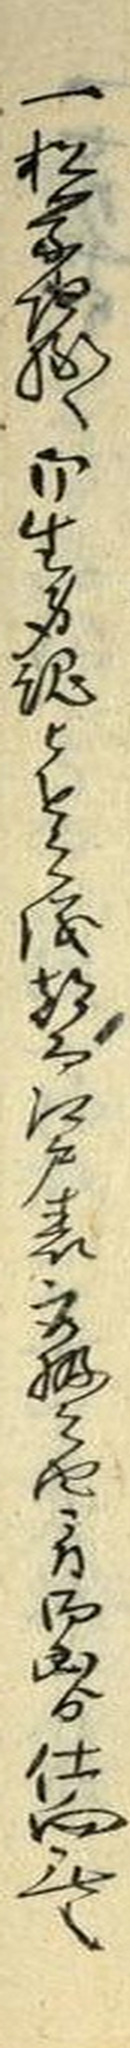一松栄院様へ御生身魂被進之儀都而江戸表取扱之由ニ付御国ゟ仕向無之
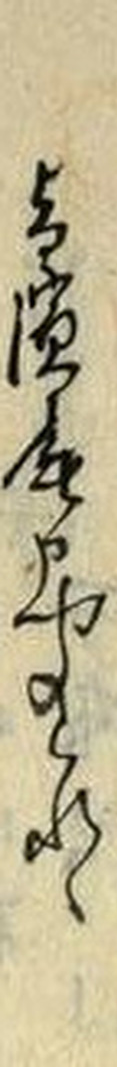旨浜尾申聞くれ候
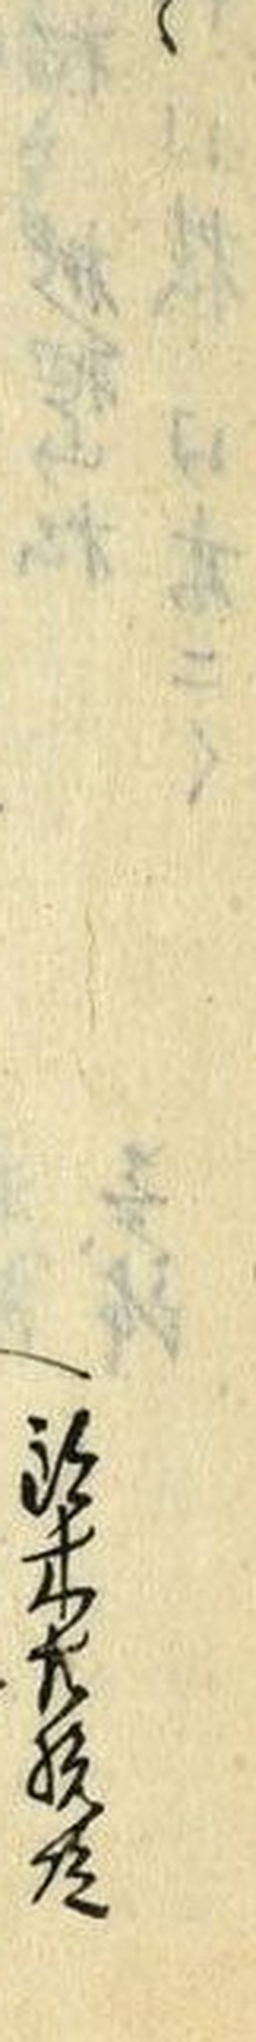鈴木左膳殿
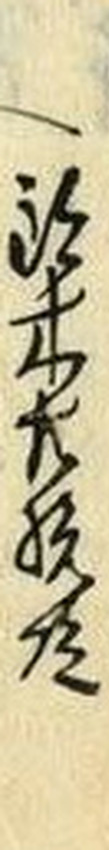鈴木左膳殿
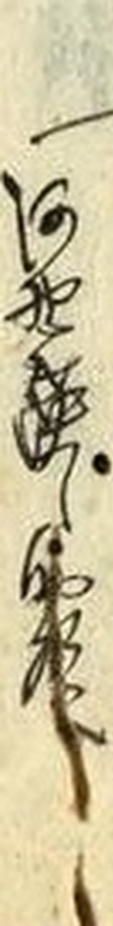河野鍈之助殿
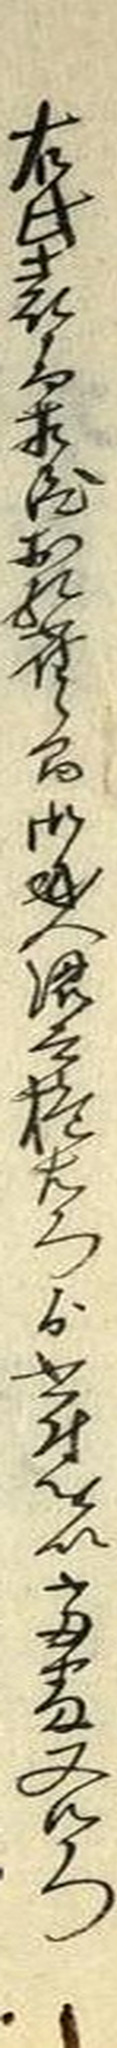右此表ニ而相渡於孔雀之間御用人渋谷権左衛門ゟ書付を以当番又左衛門
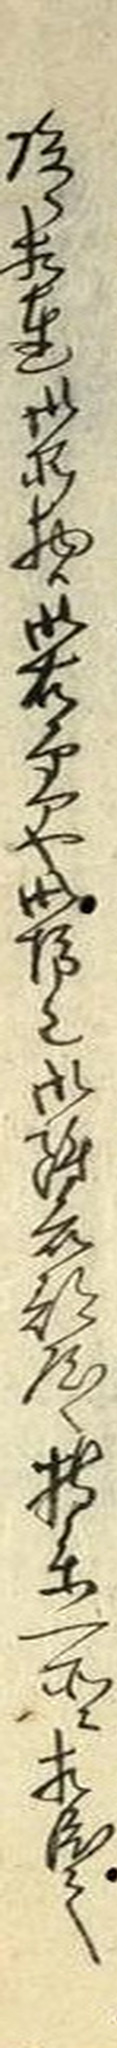殿へ相達御品物ハ御右筆部や御坊主御附衆部屋へ持参一所ニ相渡之
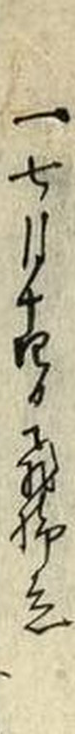一七月十四日飛脚立
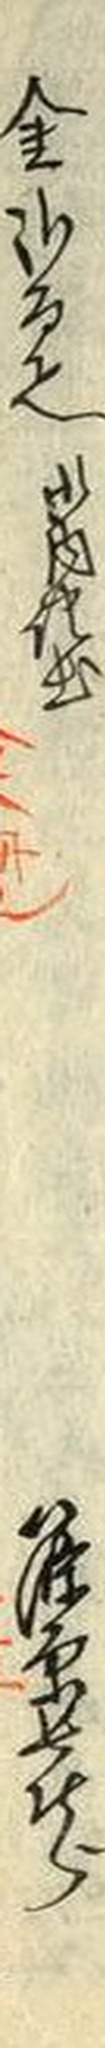金弐百疋御内証出篠原長次郎
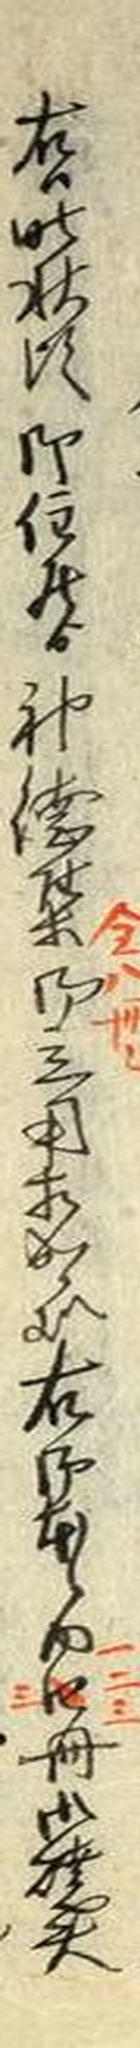右ハ昨秋頃御住居ゟ神徳集御立用相成候処右御本之内四冊御焼失
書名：少傅日録抄（斉善付側向頭取日記、江戸并道中、初入在国、逝去後…
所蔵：福井県文書館 Fukui Prefectural Archives
